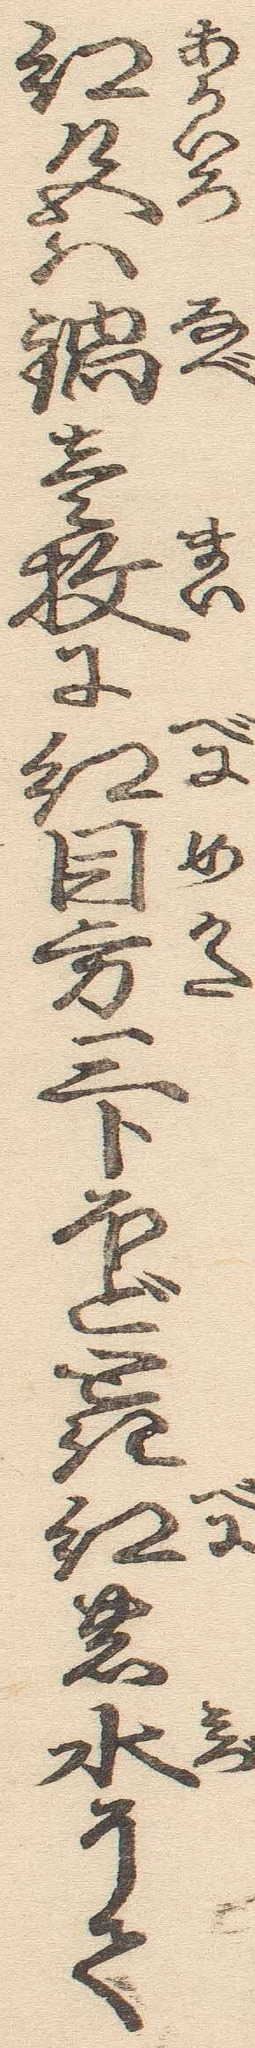紅色は鍋壱枚に紅目方三トほどとき紅の水にて

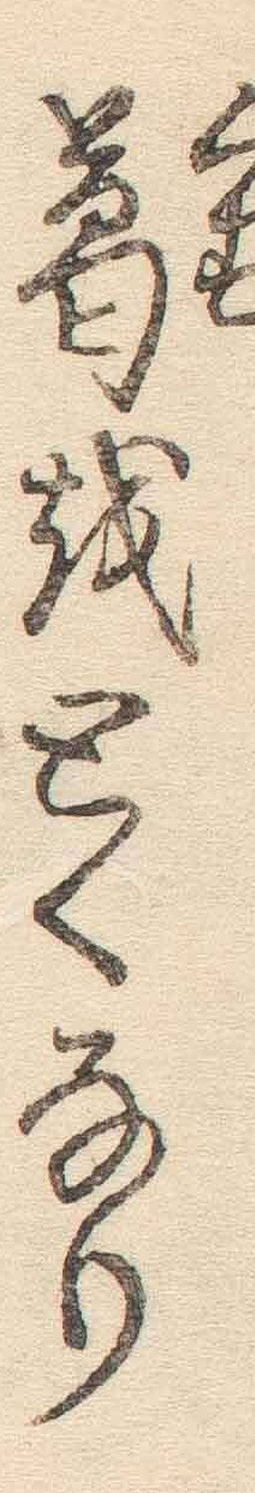葛をとくなり
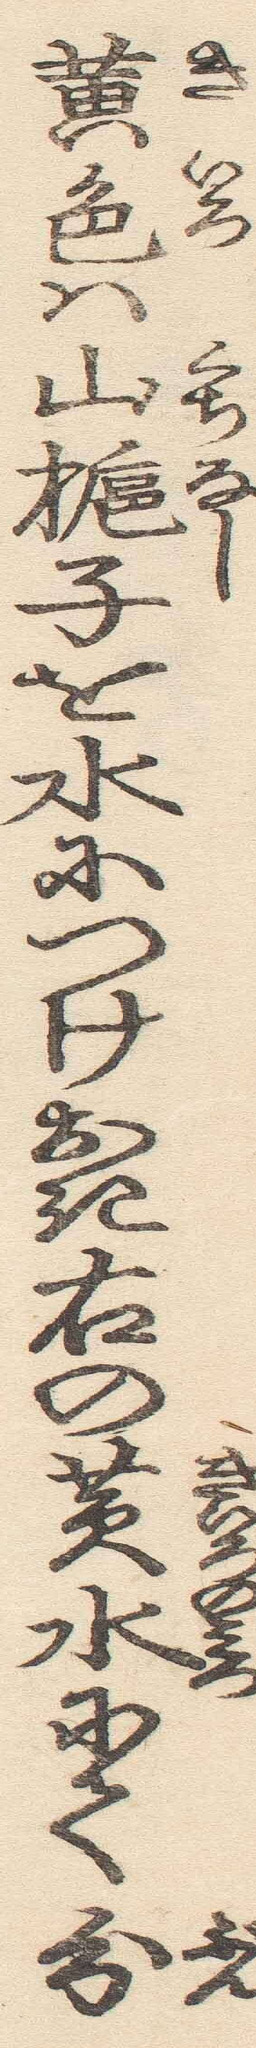黄色は山梔子を水につけおき右の黄水にて分
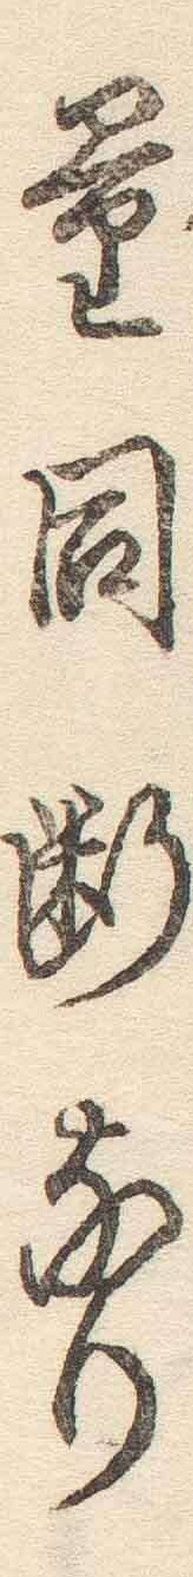量同断なり
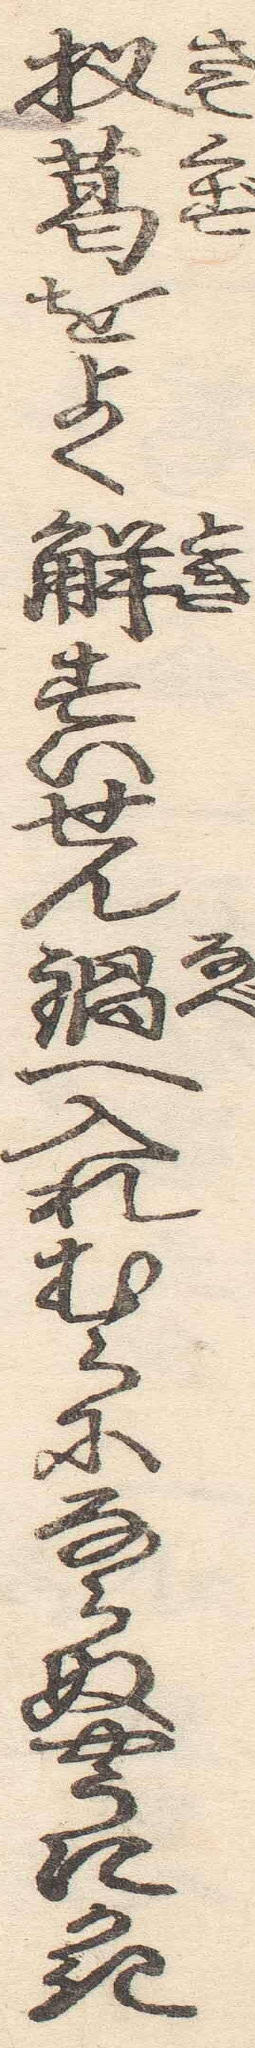扨葛をよく鮮すいせん鍋へ入れむらにならぬやうにかき
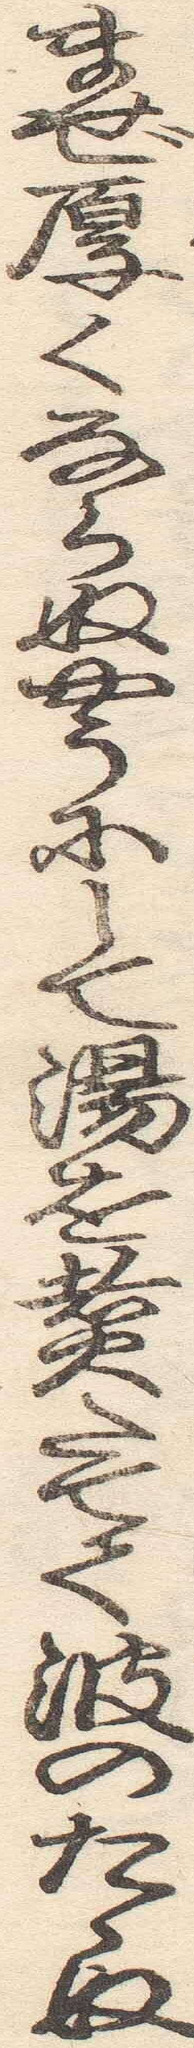まぜ厚くならぬやうにして湯を煮てて波のたヽぬ
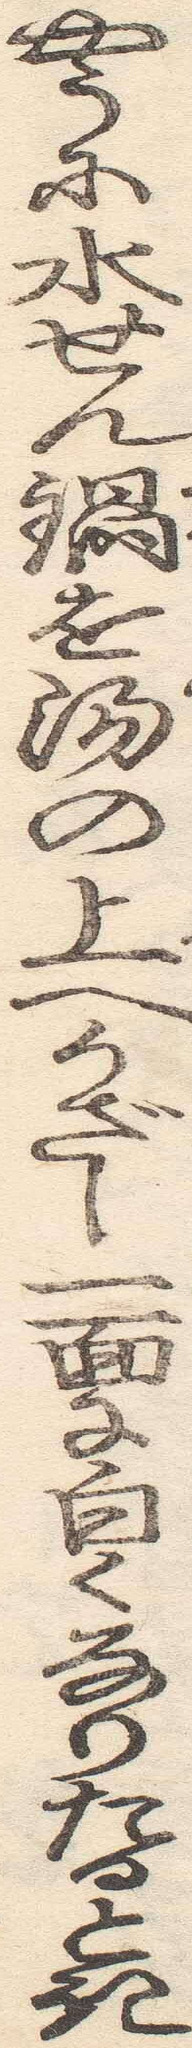やうに水せん鍋を湯の上へかざし一面に白くなりたるとき
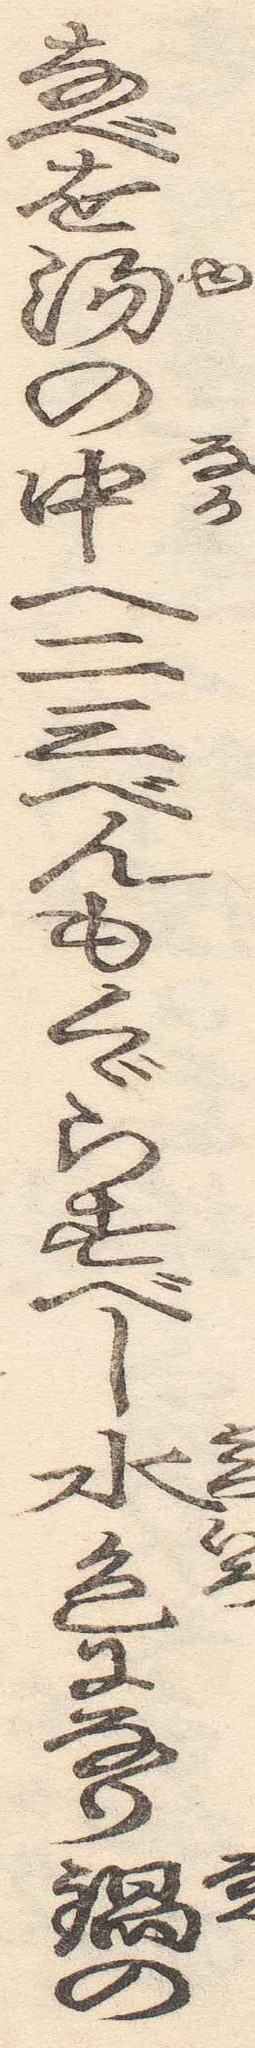なべを湯の中へ二三べんもくゞらすべし水色になり鍋の
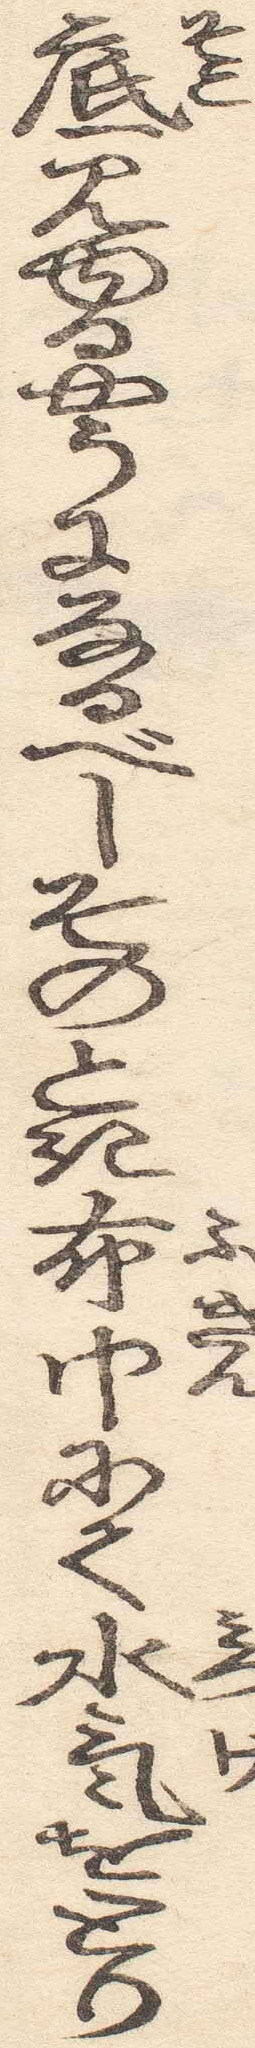底見ゆるやうになるべしそのとき布巾にて水気をとり
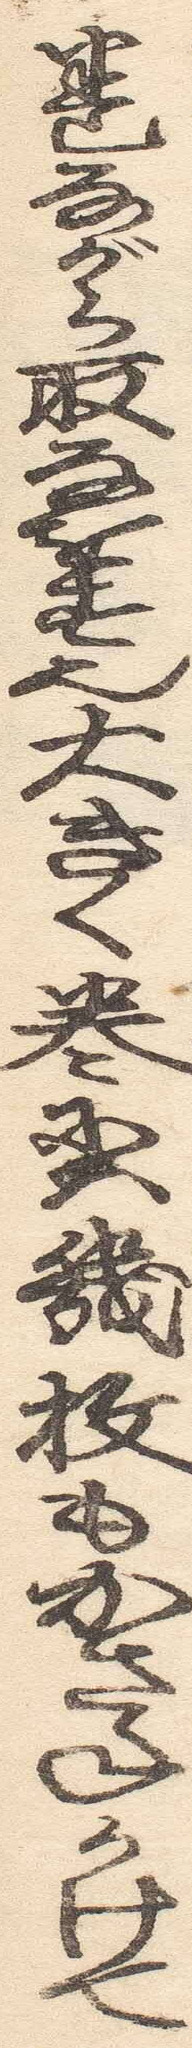巻ながら取なをす也大きく巻には幾枚もかさねかけて
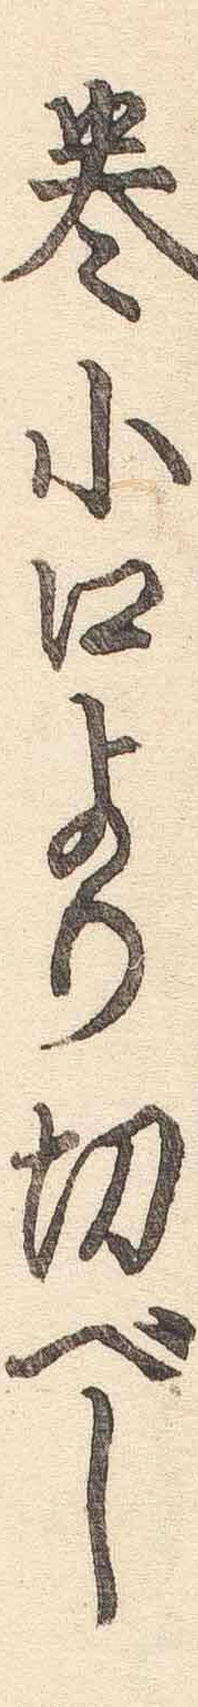巻小口より切べし
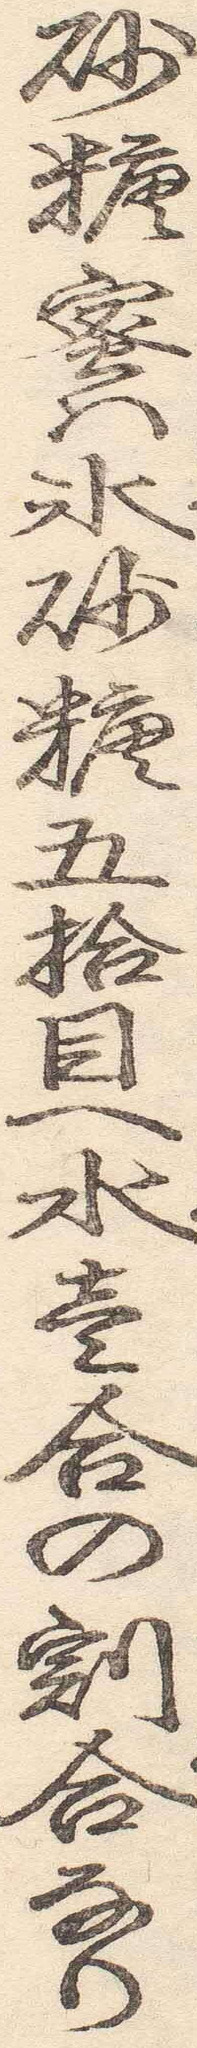砂糖蜜は氷砂糖五拾目へ水壱合の割合なり
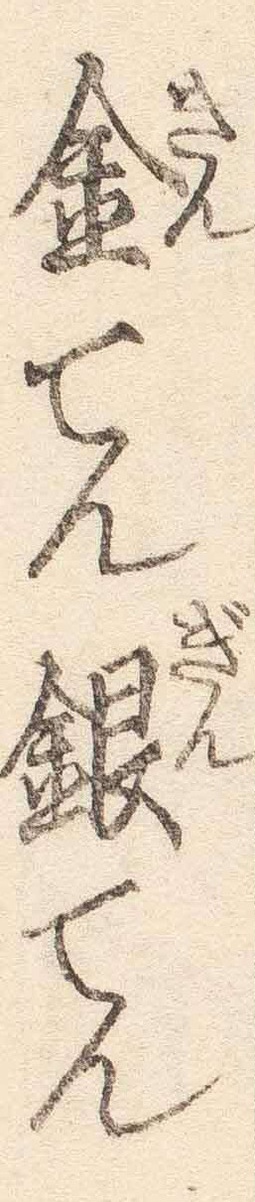金てん銀てん
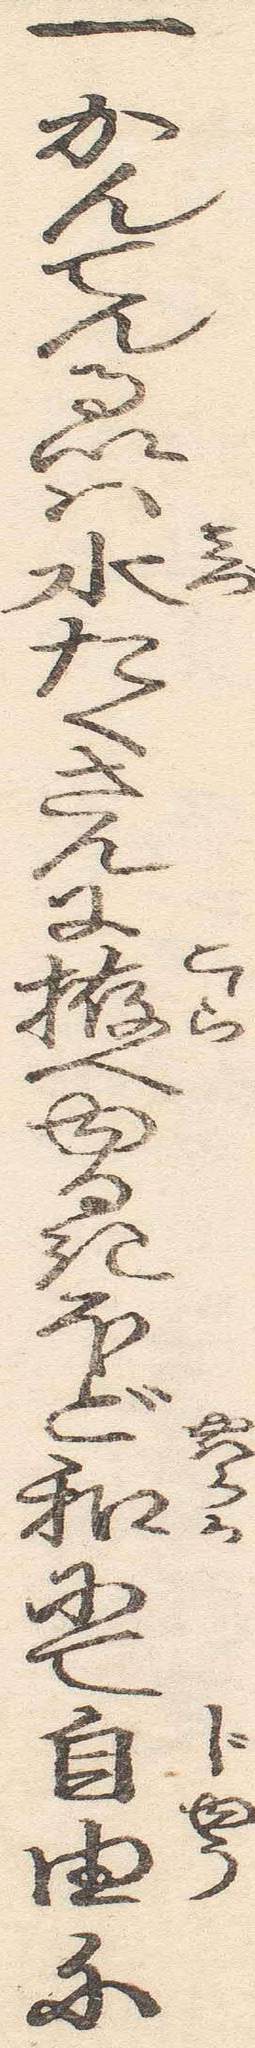一かんてんるいは水たくさんに拵へゆるきほど和にて自由に
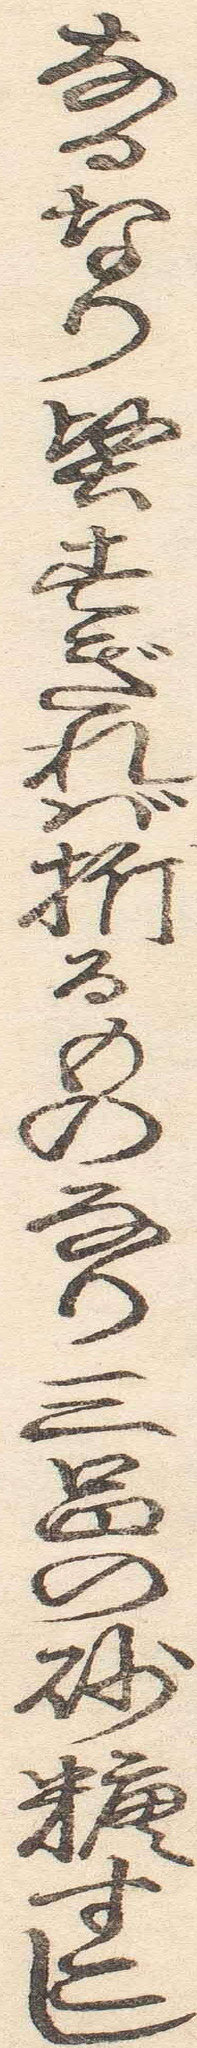なるなり堅すぎれば折るものなり三品の砂糖すこし
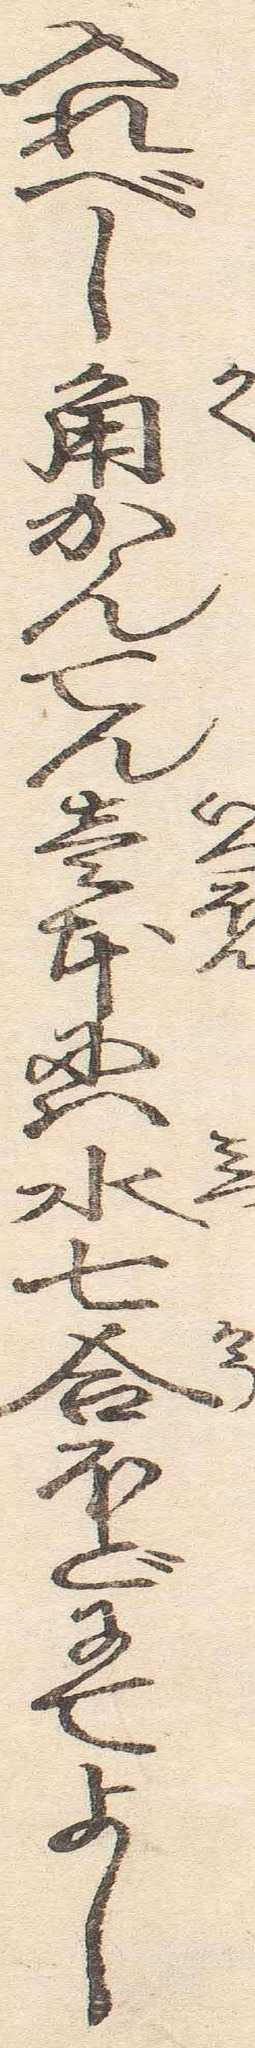入れべし角かんてん壱本には水七合ほどにてよし
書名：料理通
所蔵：東京学芸大学附属図書館 国文学研究資料館
